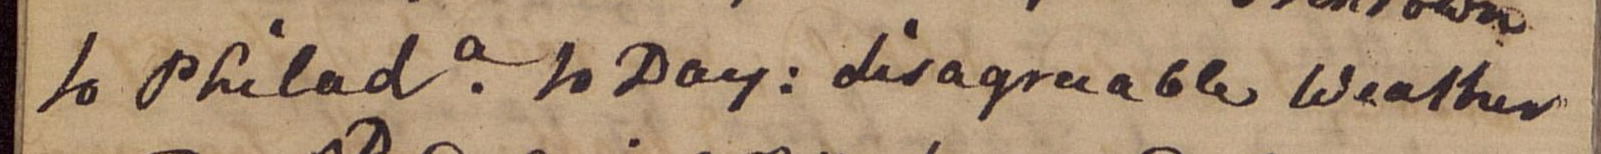to Philad^a. To Day: disagreeable Weather
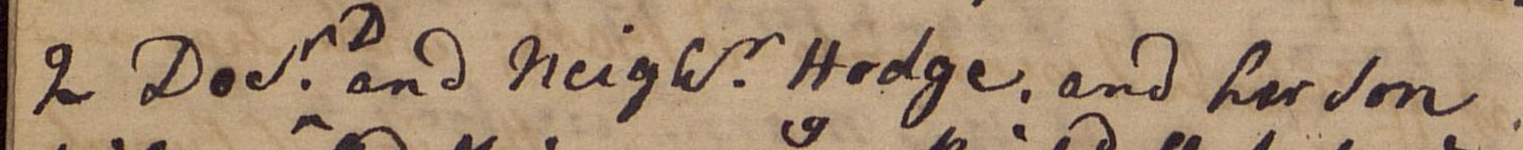2 Doc^r. ^D and Neig^r. Hodge, and her son
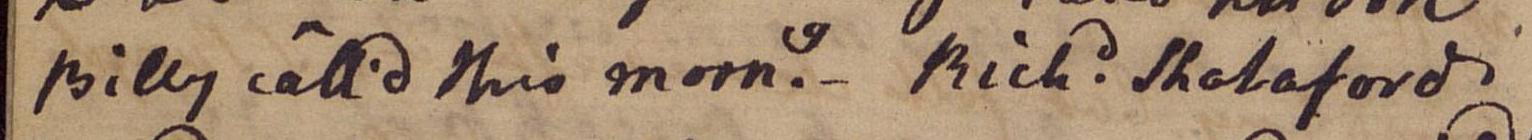Billy call'd this morn^g.- Rich^d Sha[l]aford
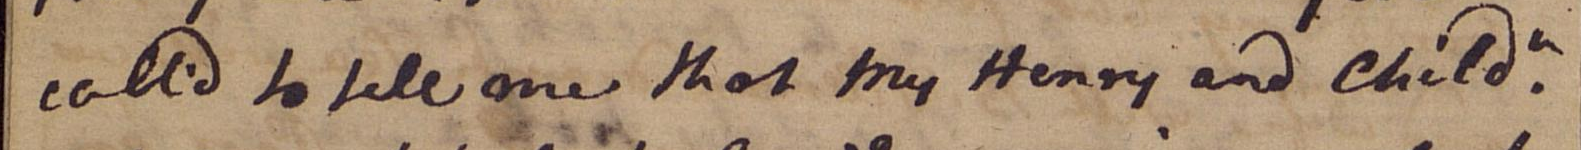call'd to tell me that my Henry and child^n.
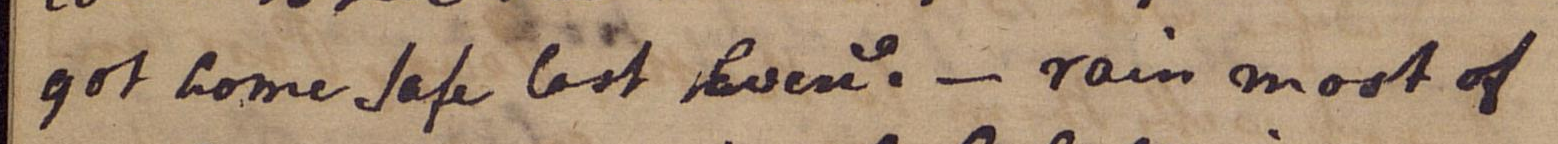got home Safe last Even^g.- rain most of
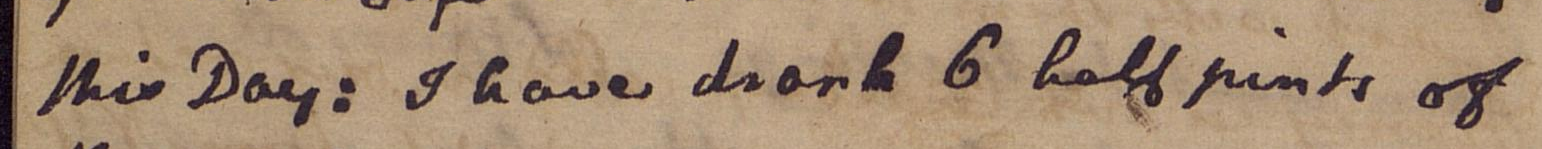this Day: I have drank 6 half pints of
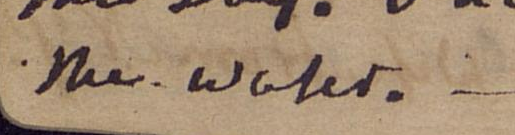the water.-
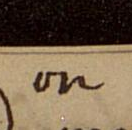on
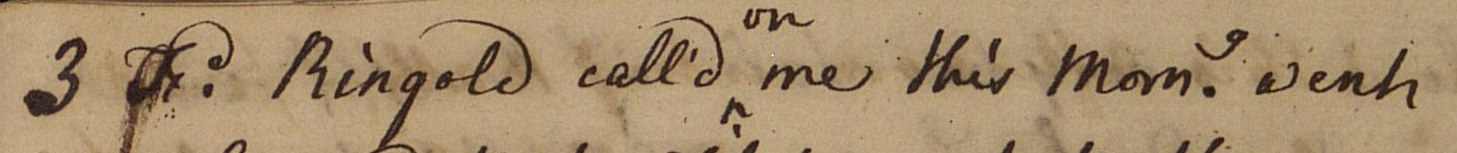3 Fr^d. Ringold call'd ^ me this Morn^g. went
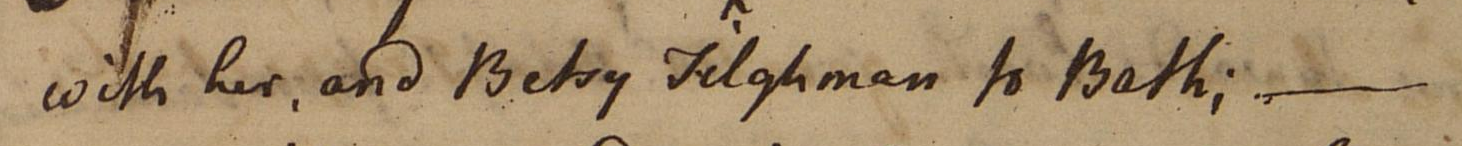with her, and Betsy Tilghman to Bath;-
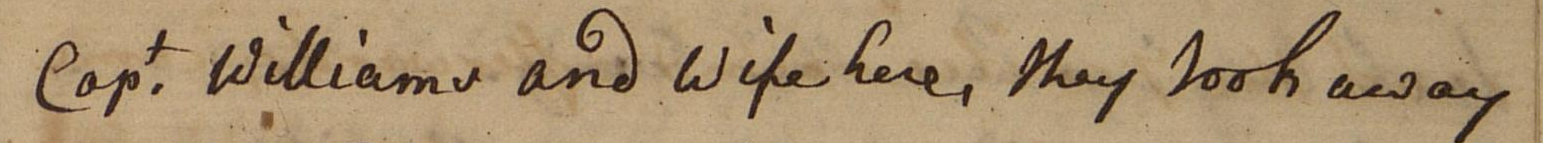Cap^t. Williams and wife here, they took away
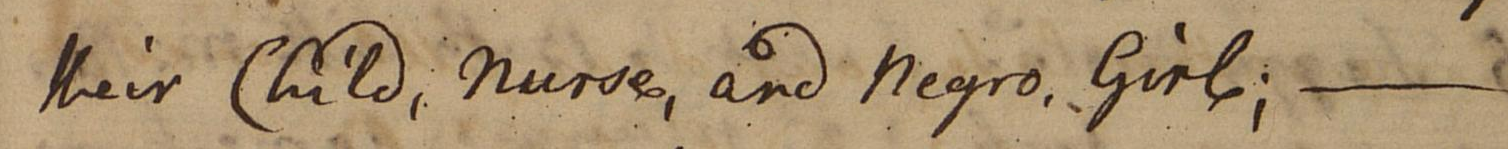their Child, Nurse, and Negro, Girl;-
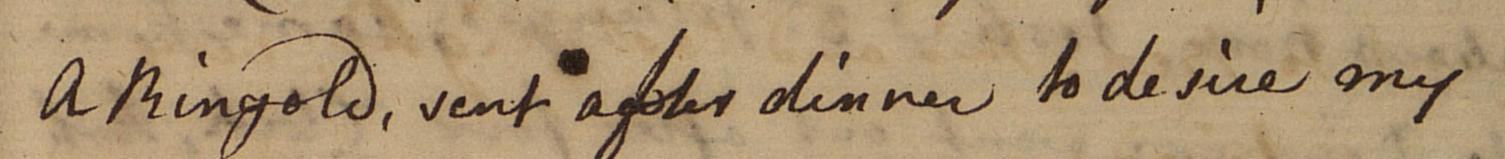A Ringold, sent after dinner to desire my
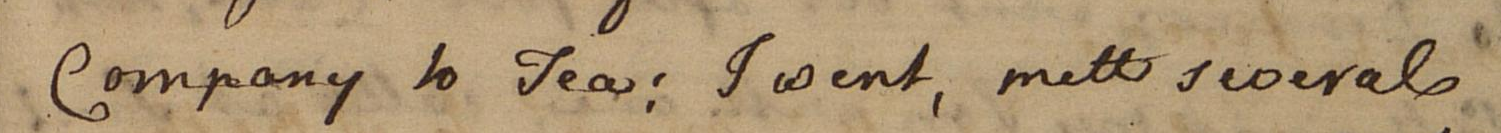Company to Tea: I went, mett several
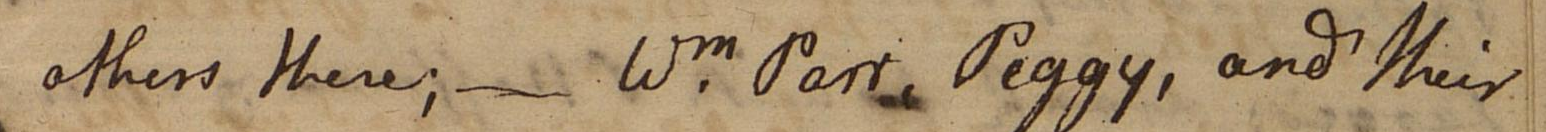others there;- W^m. Parr, Peggy, and their
